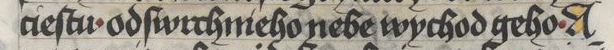cieſtu.odſwrchnieho nebe wychod geho.A
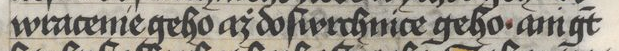wracenie geho až doſwrchnice geho.ani ḡt
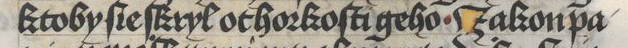ktoby ie ſkryl othorkoſti geho.Zakon pa¬
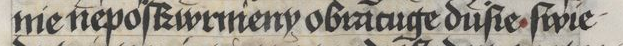nie nepoẛkwrnieny obratuge duẛie.ſwie¬
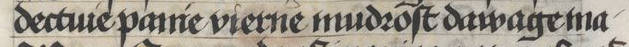dectuíe panie vierne mudroſt dawage ma¬
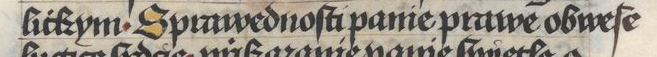liċkym.Sprawedlnoſti panie prawe obweſe¬
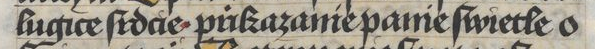lugice ſrdcie.pṙikazaníe panie ſwietle o¬
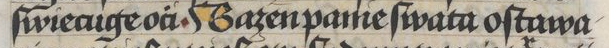wiecuge oċi.Bazen panie ſwata oſtawa¬
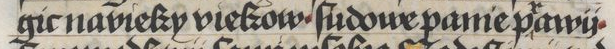gic navieky viekow.ſudowe panie prawij.
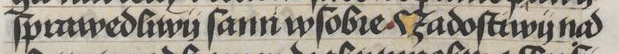ſprawedliwij ſami wſobie.Zadoſtiwij nad
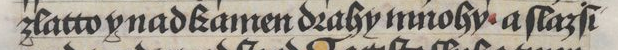zlatto y nad kamen drahy mnohy.a slazẛí
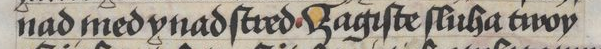nad med y nad ſtred.Zagiſte ſluha twoy
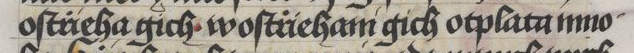oſṙieha gich.w oſtṙiehaní gich otplata mno¬
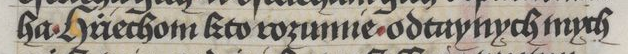ha.Hṙíechom kto rozumie.odtaynych mych
